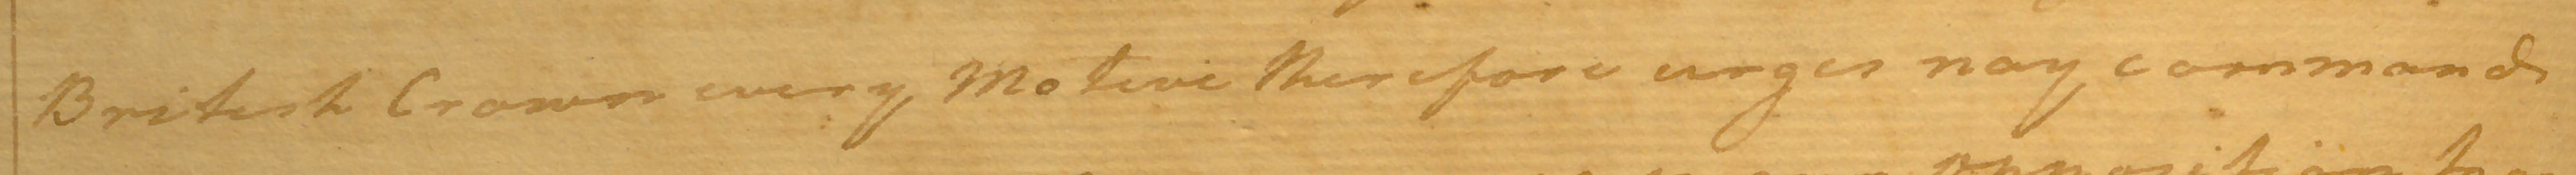British Crown every Motive therefore urges nay commands
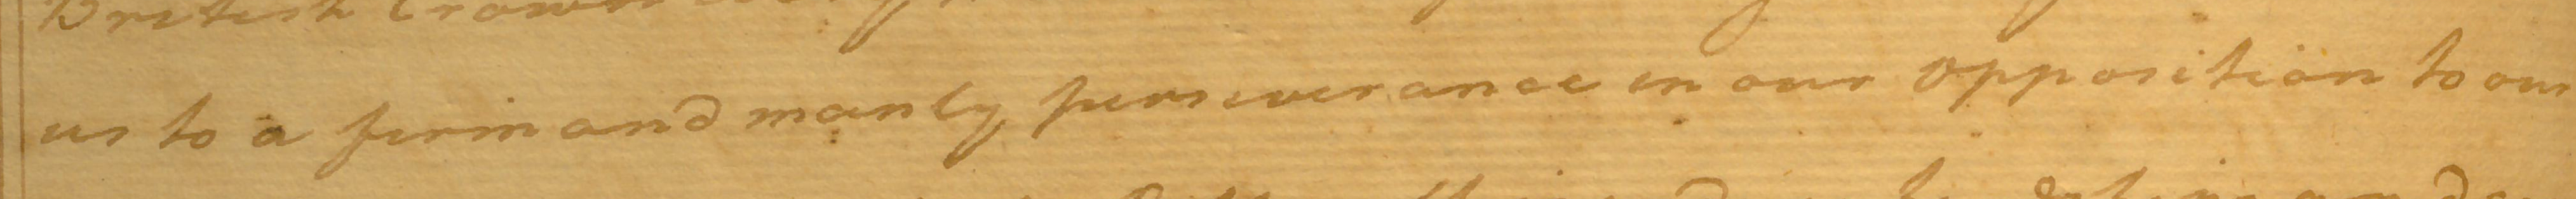us to a firm and manly perseverance in our opposition to our
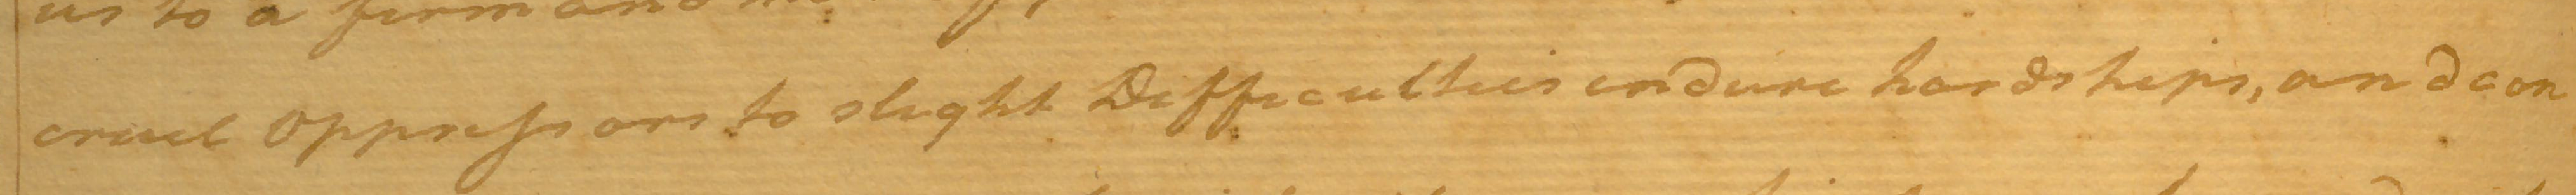cruel oppressors to slight Difficulties endure hardships, and con
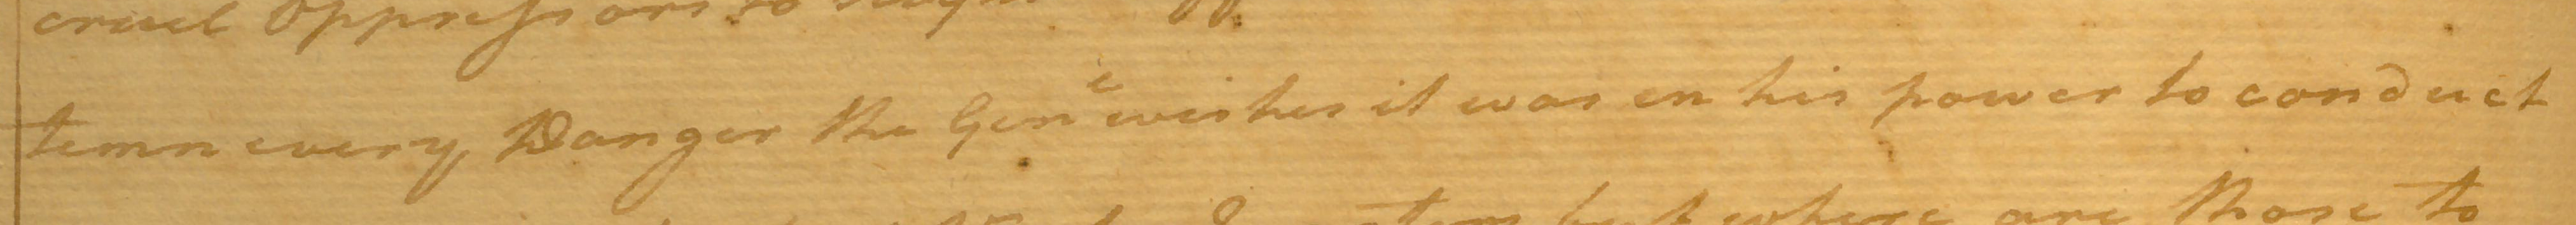temn every Danger the Gen^l. wishes it was in his power to conduct
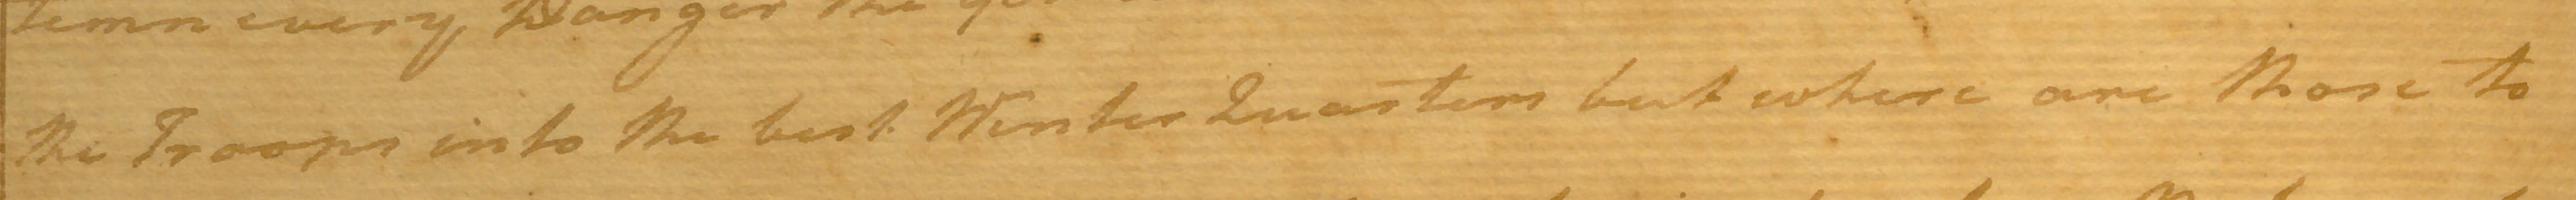the Troops into the best Winter Quarters but where are those to
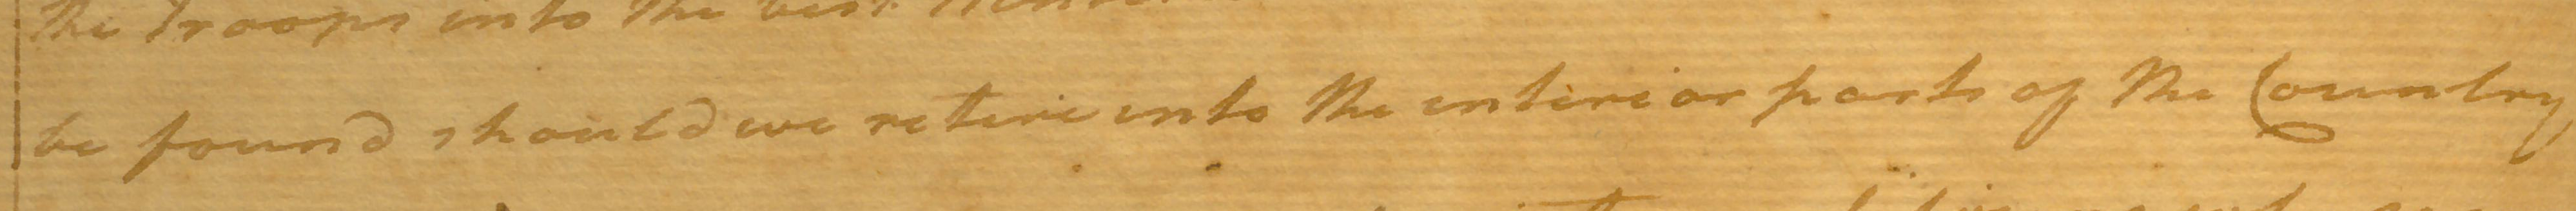be found should we retire into the interior parts of the Country
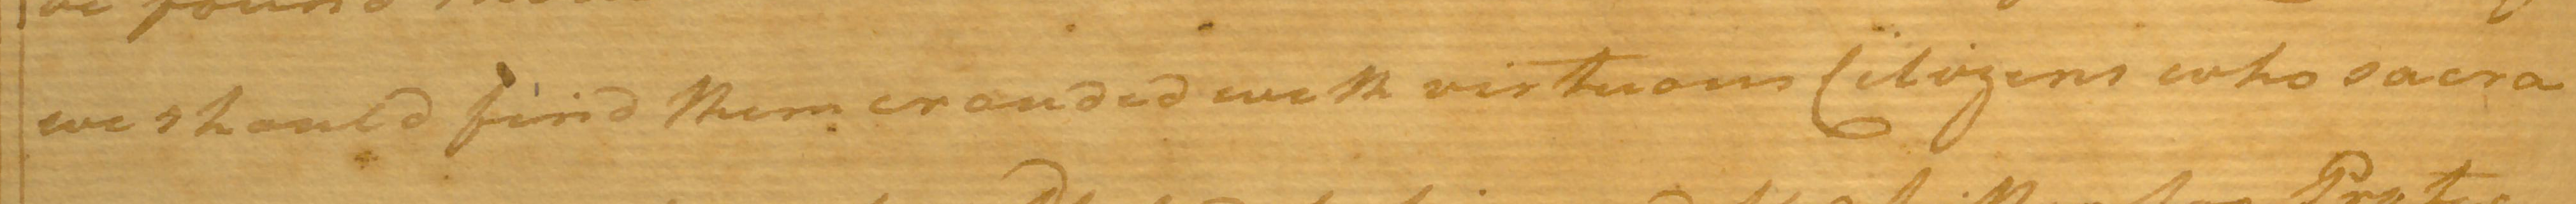we should find them crowded with virtuous Citizens who sacra
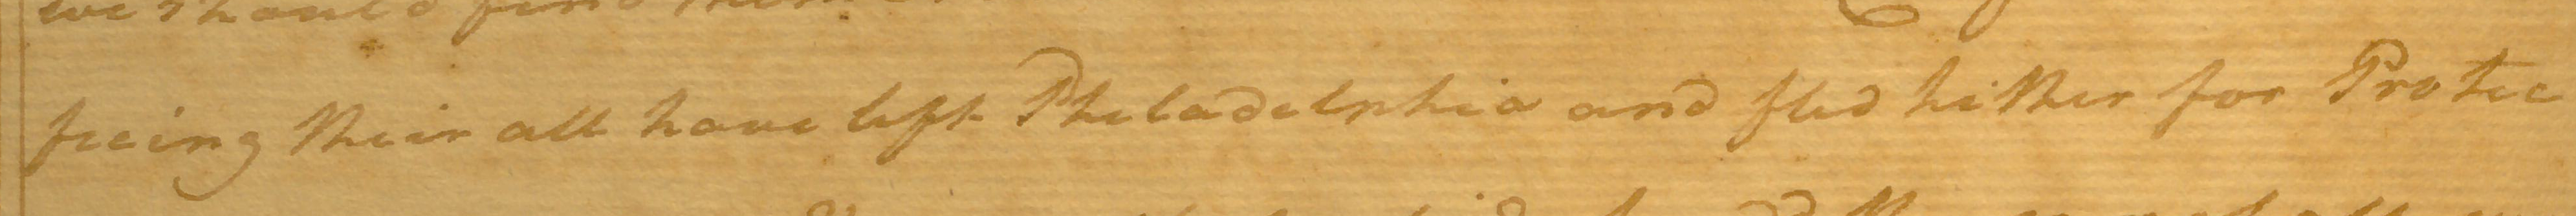ficing their all have left Philadelphia and fled hither for Protection
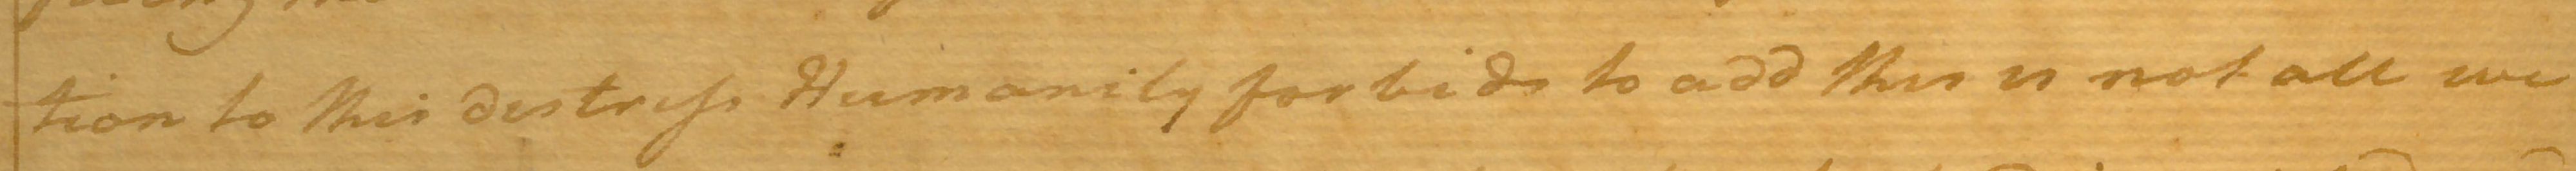tion to their distress Humanity forbids to add this is not all we
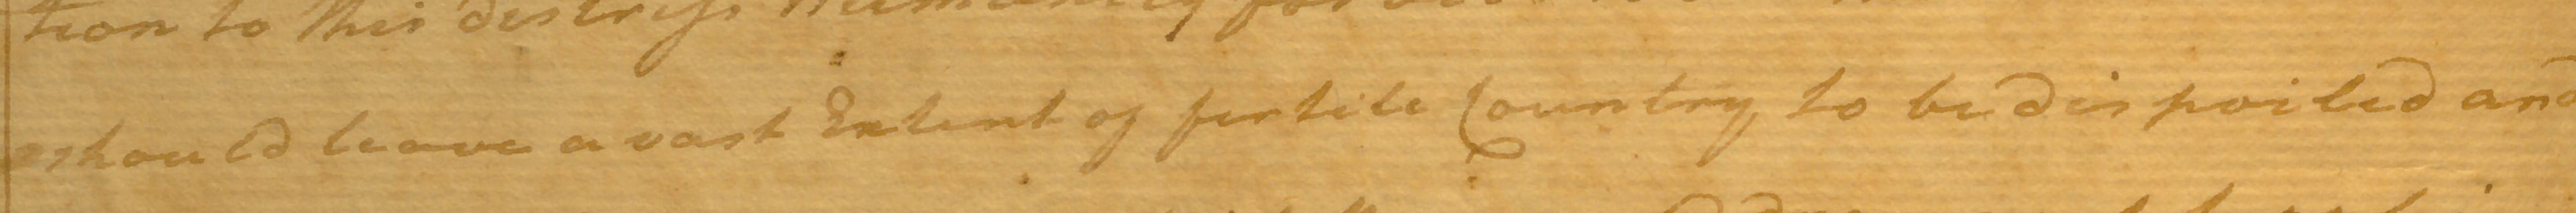should leave a vast Extent of fertile Country to be dispoiled and
